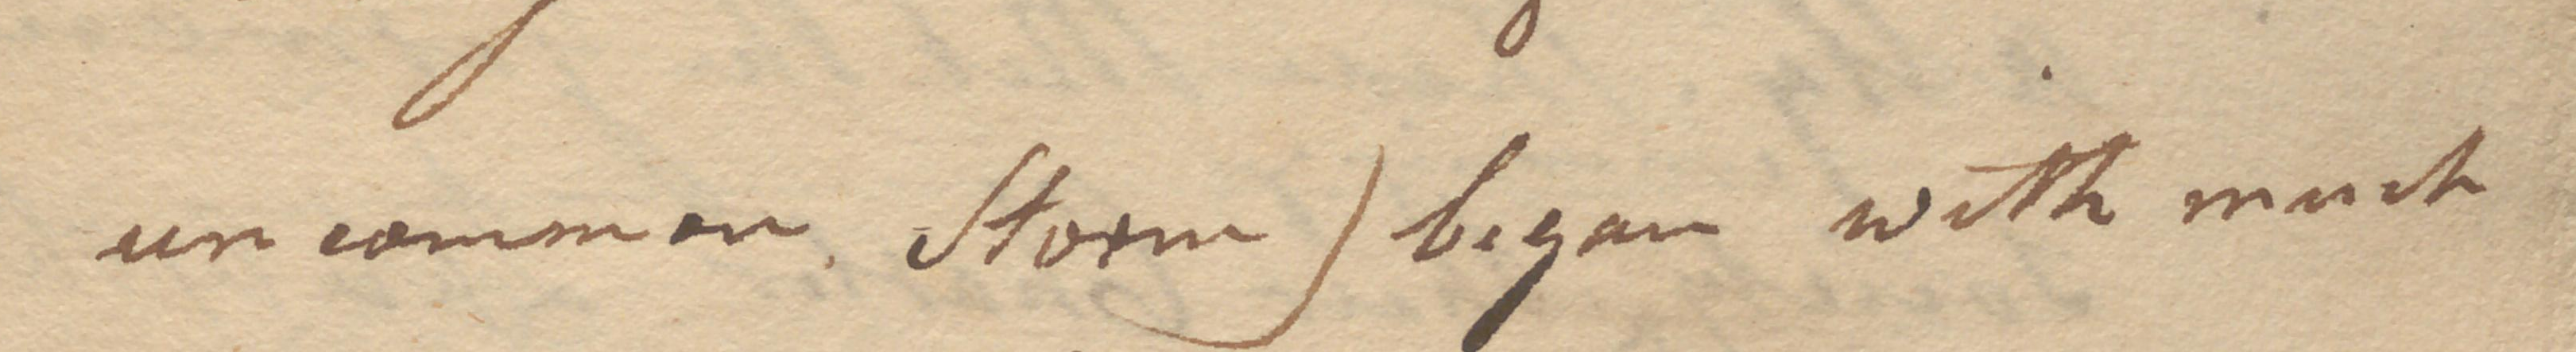uncommon. Storm) began with much
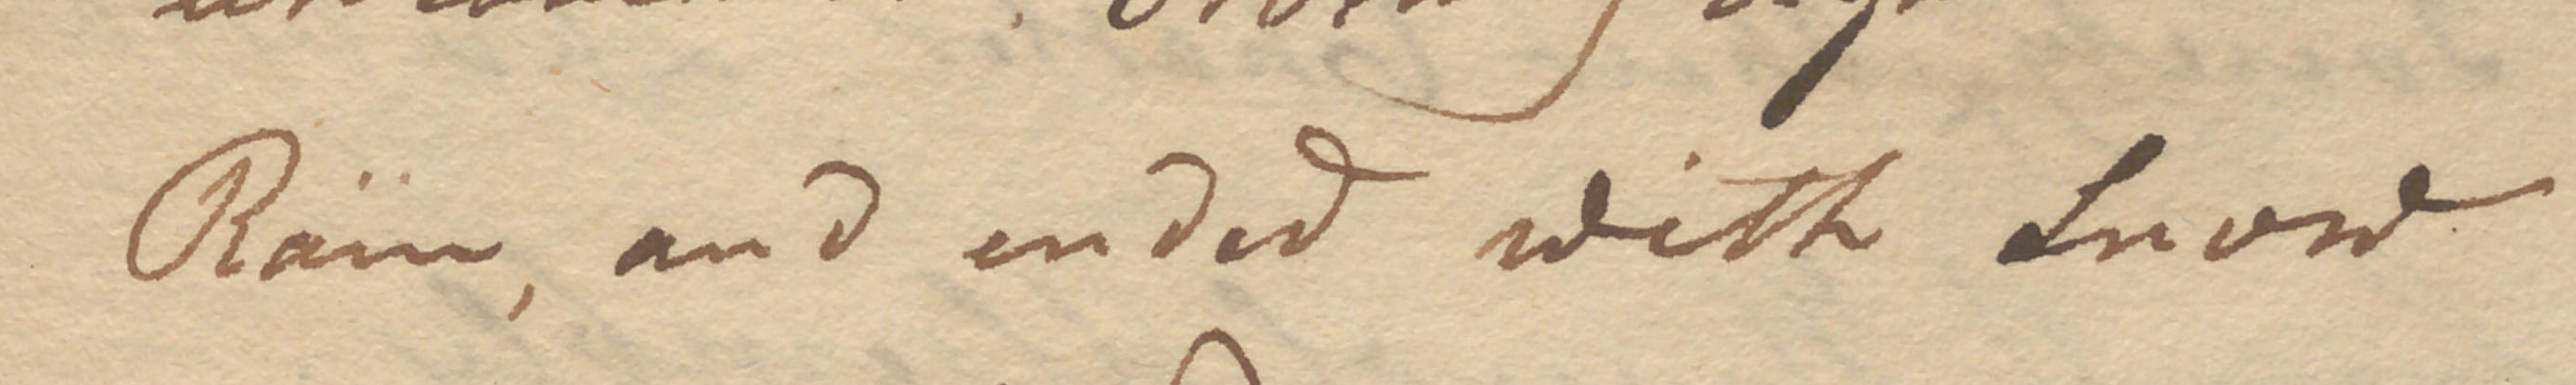Rain and ended with snow
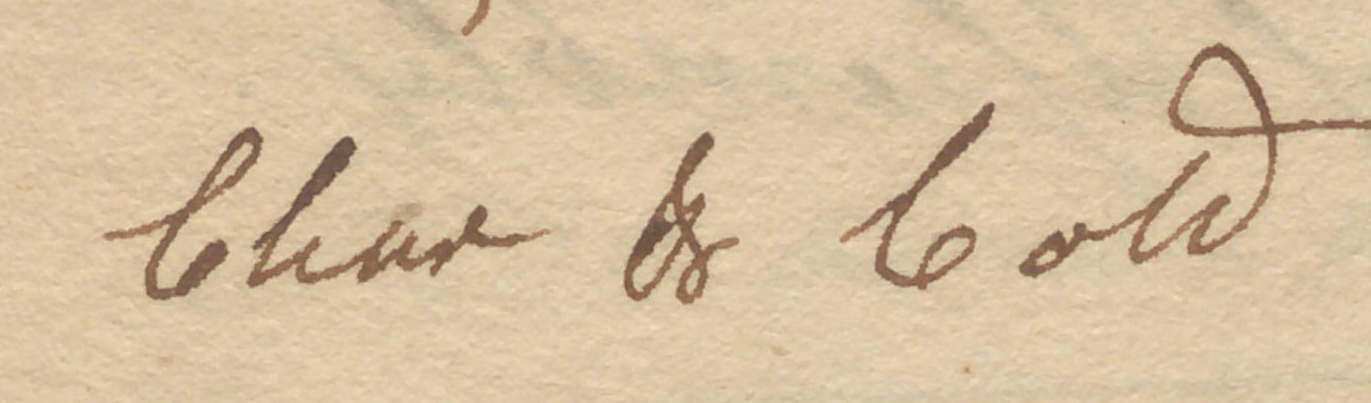Clear & Cold
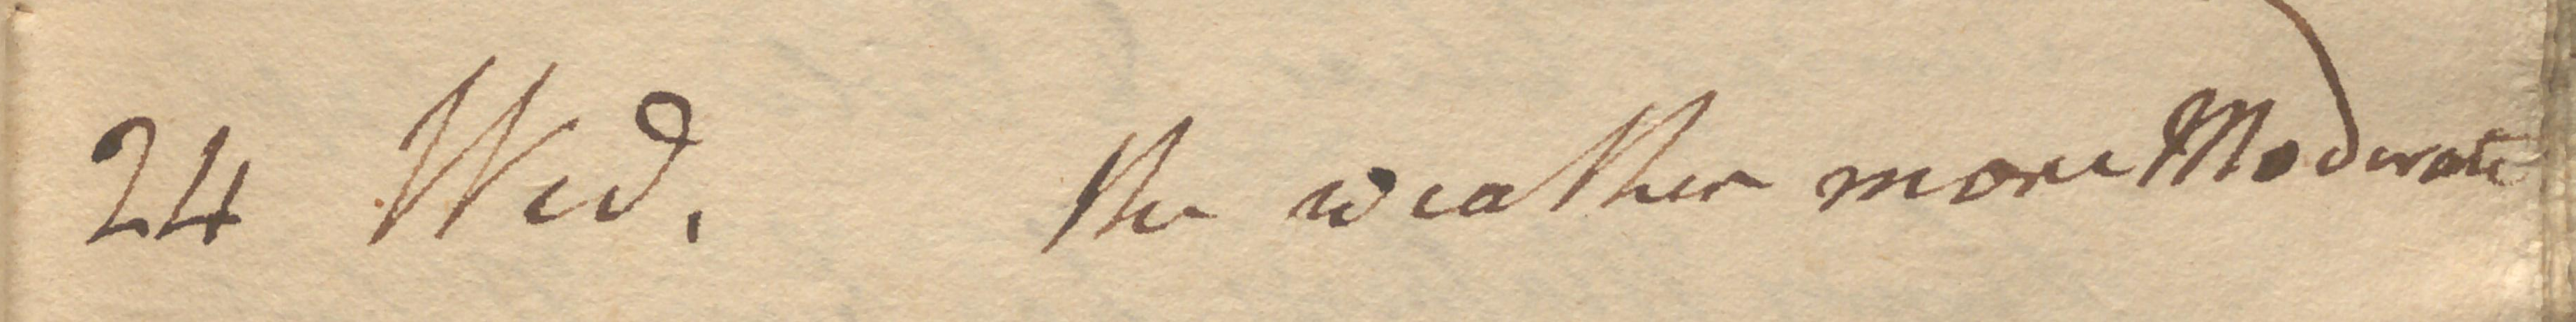24 Wed. the weather more Moderate
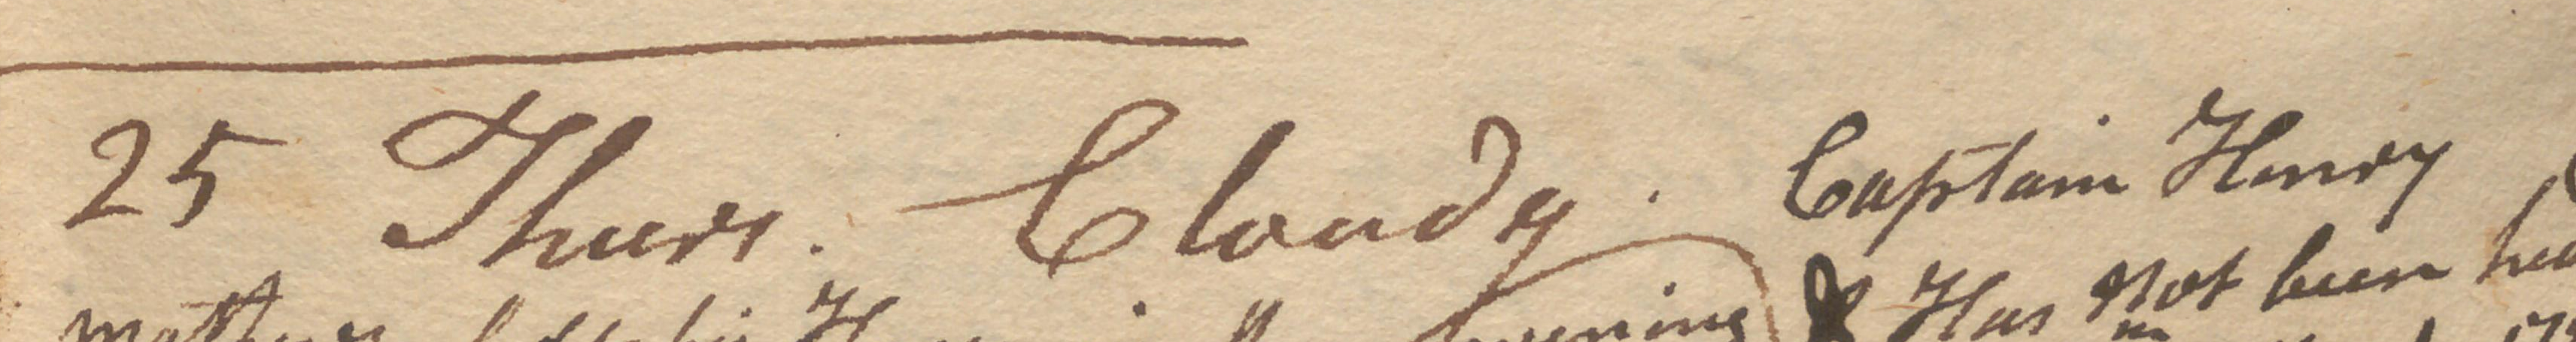25 Thurs. Cloudy Captain Henry
